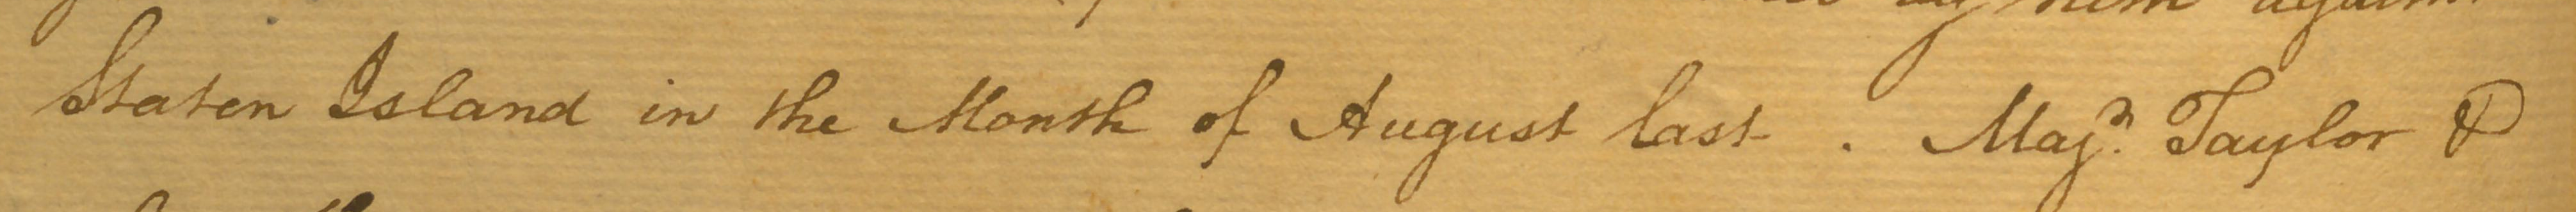Staten Island in the Month of August last. Maj^r. Taylor &
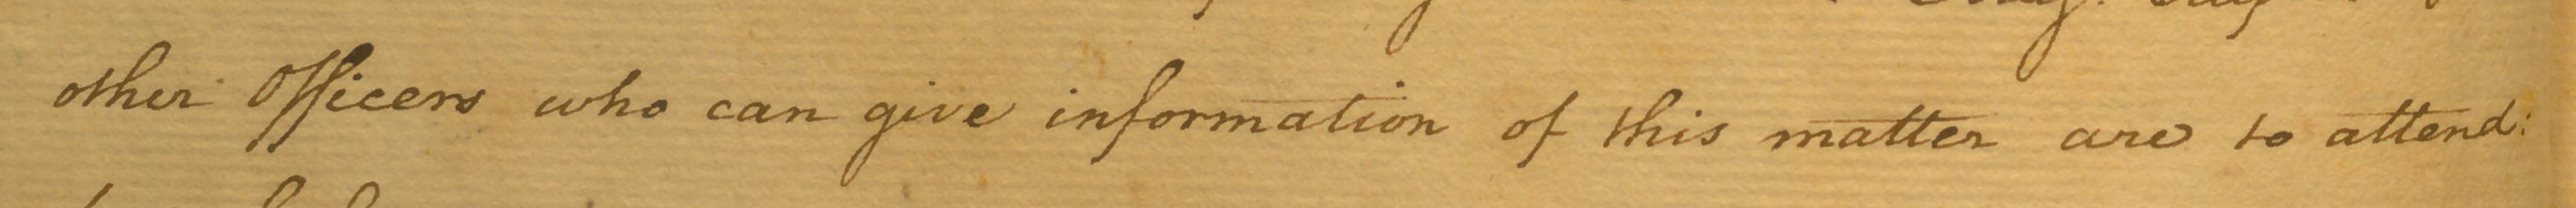other Officers who can give information of this matter are to attend:
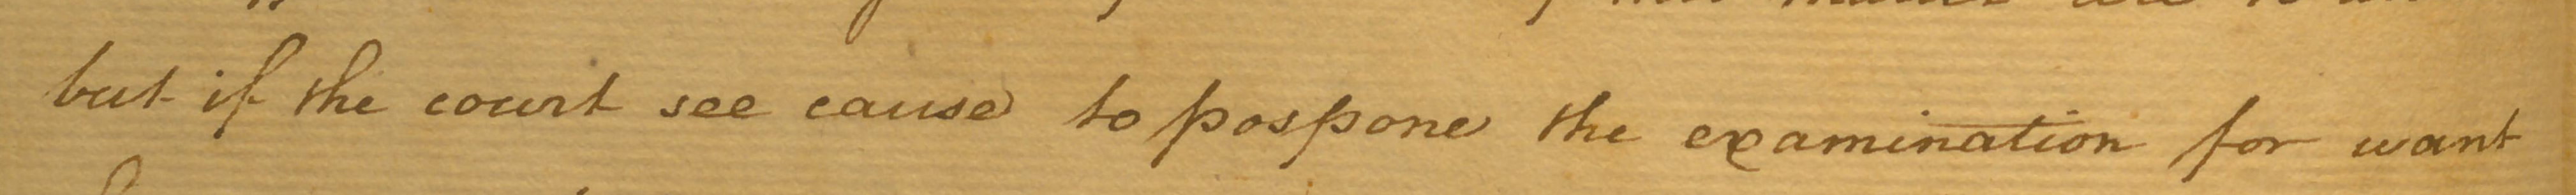but if the court see cause to pospone the examination for want
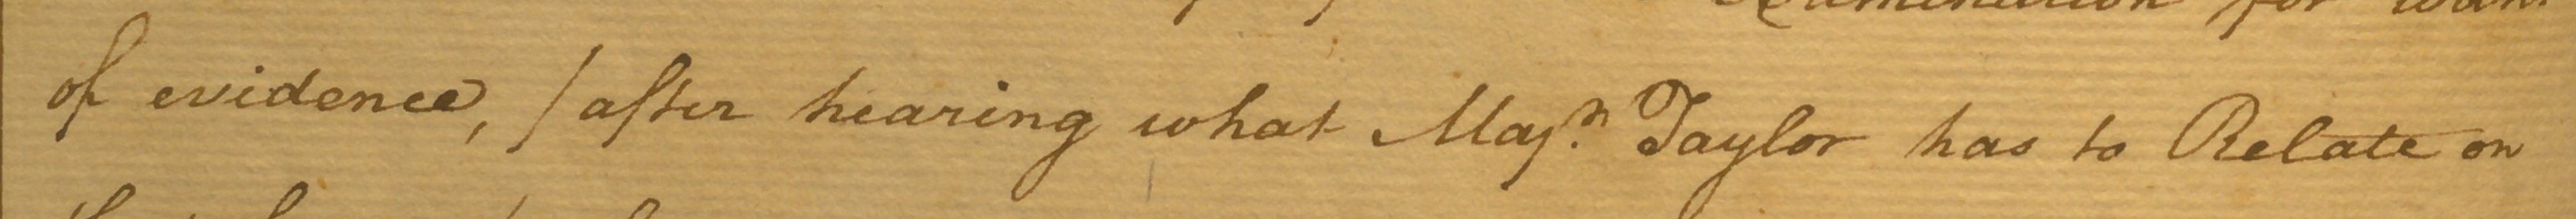of evidence, /after hearing what Maj^r. Taylor has to Relate on
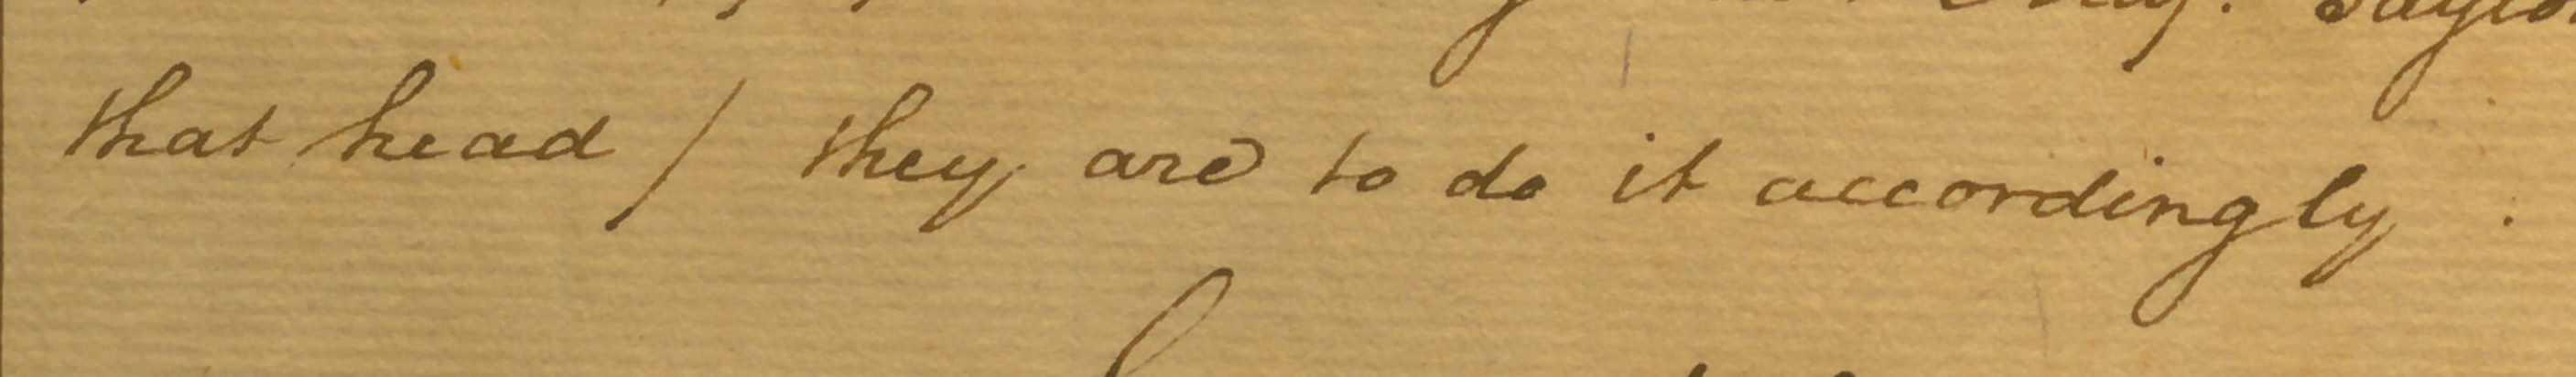that head/ they are to do it accordingly.
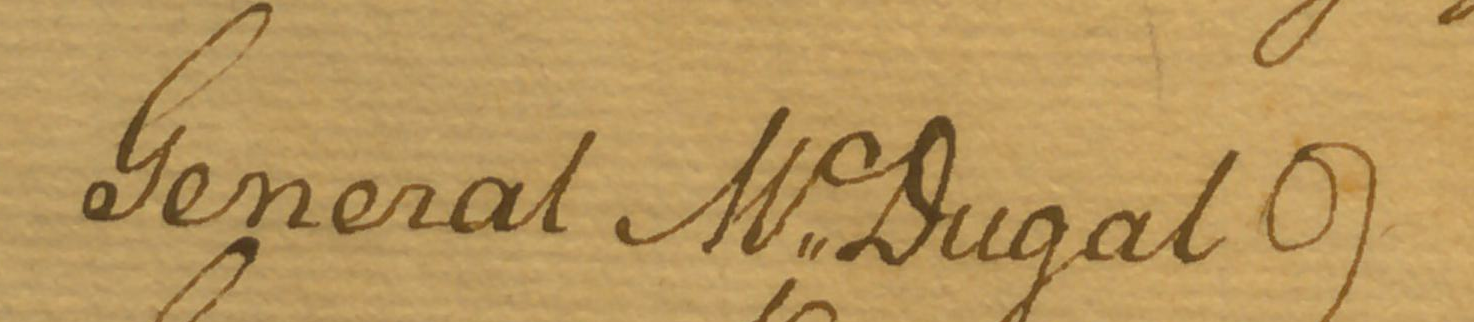General M^c.Dugal
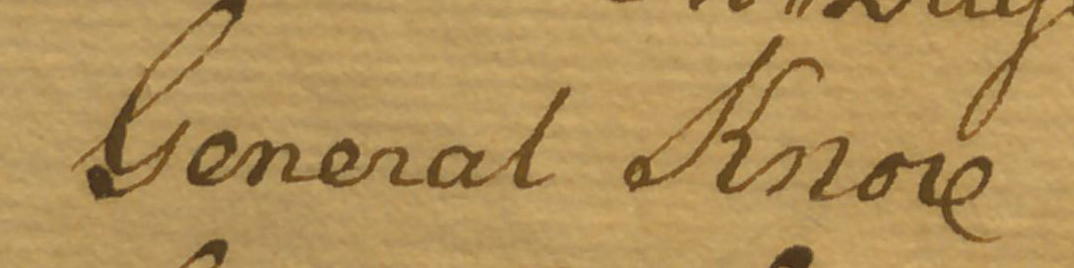General Knox
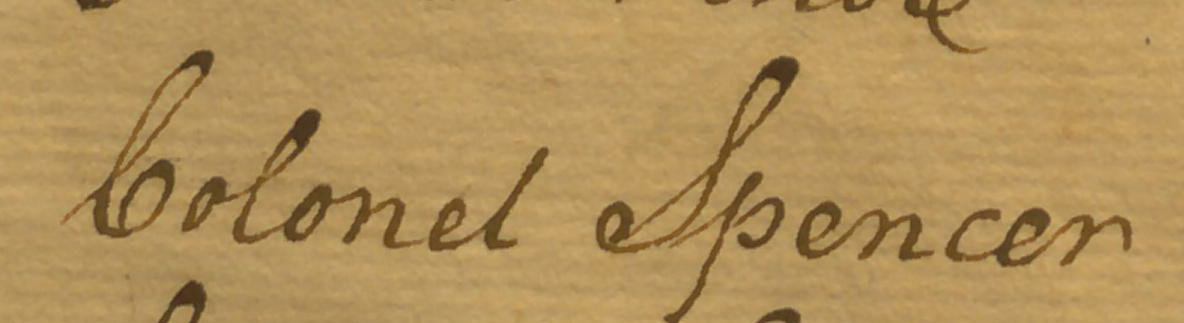Colonel Spencer
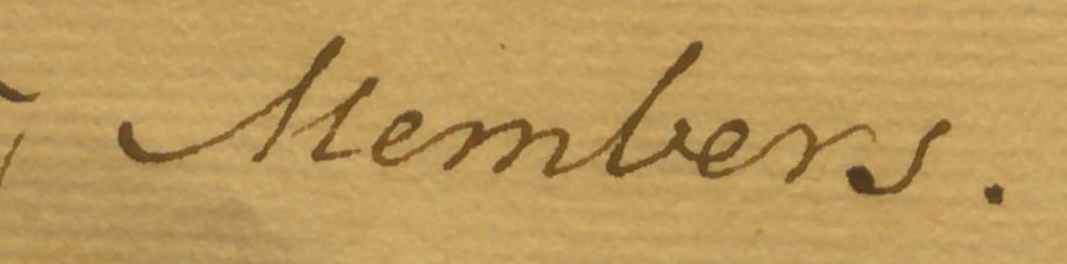Members.
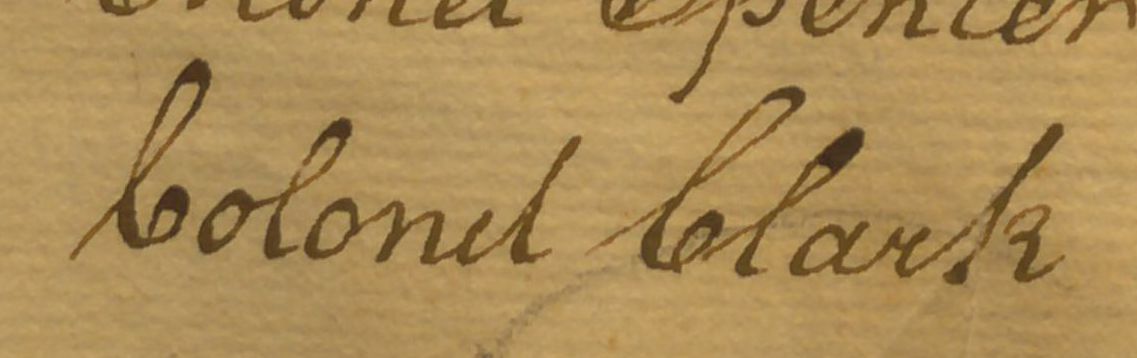Colonel Clark
